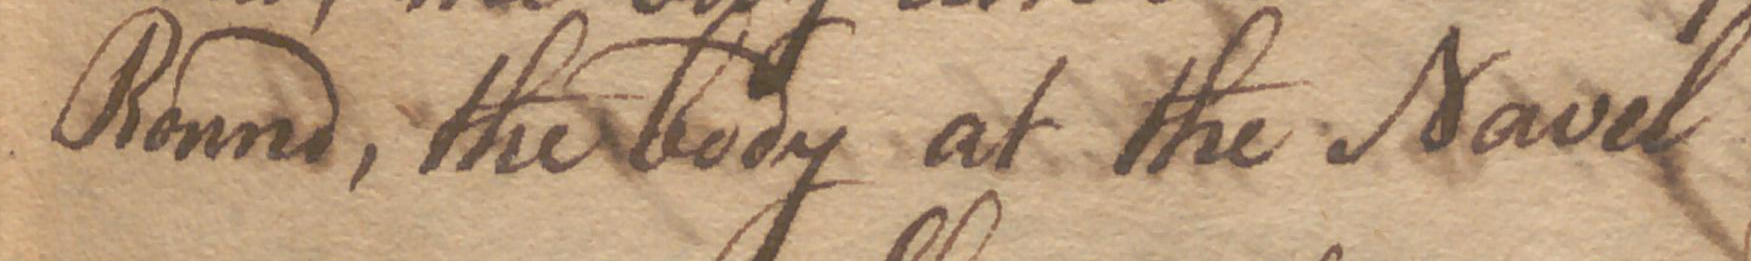Round, the body at the Navel
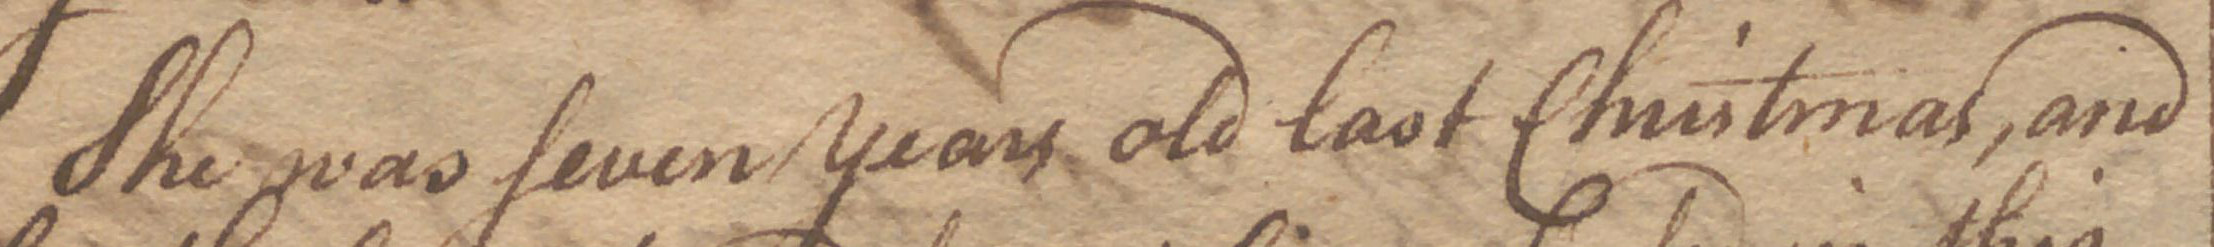She was seven years old last Christmas, and
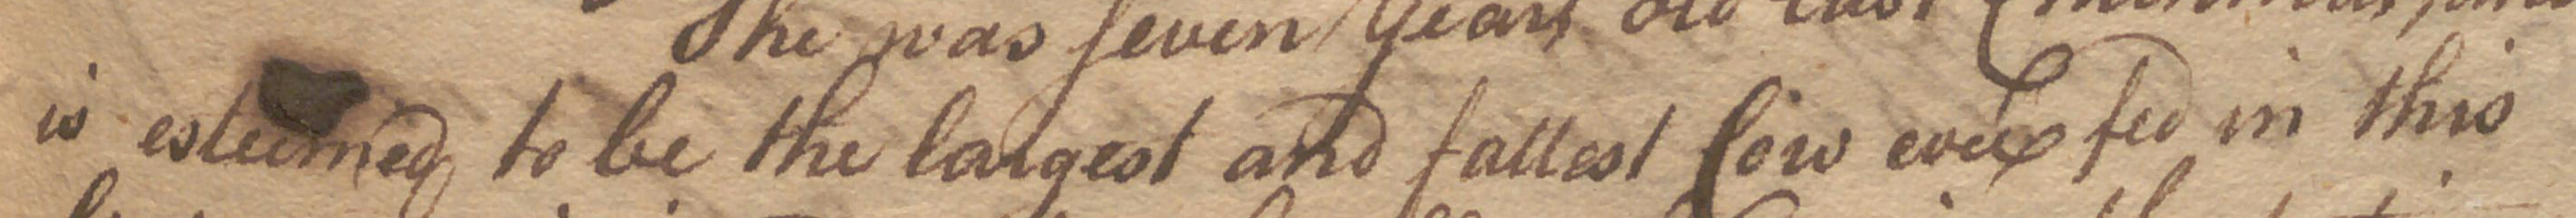is esteemed to be the largest and fattest Cow ever fed in this
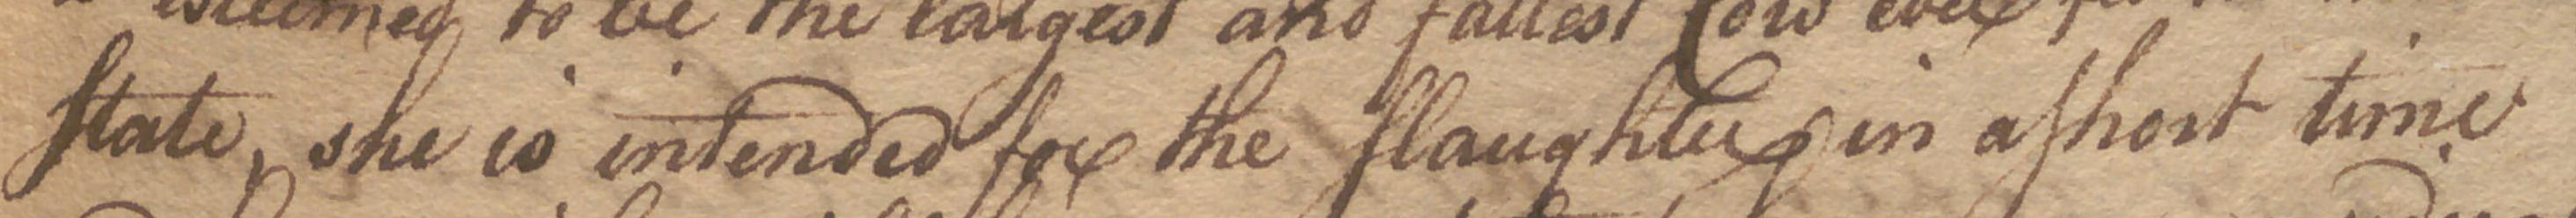state, she is intended for the slaughter in a short time
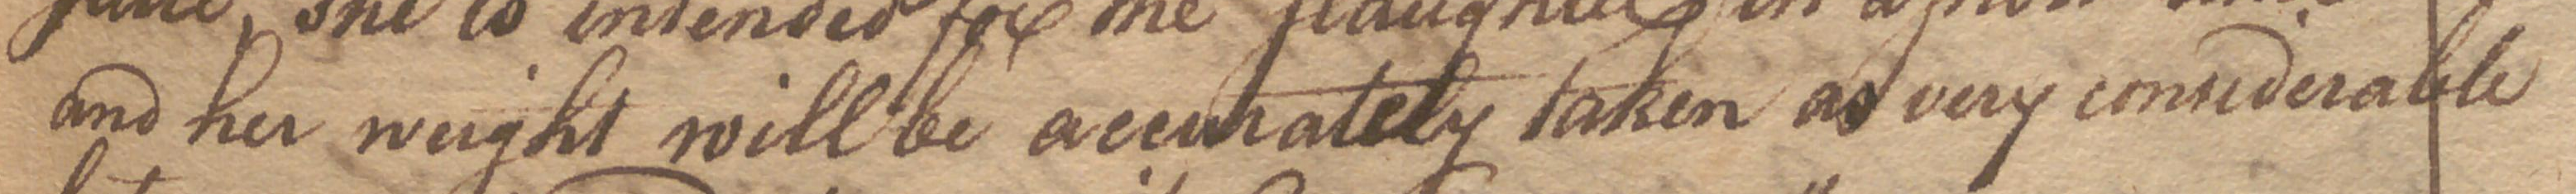and her weight will be accurately taken as very considerable
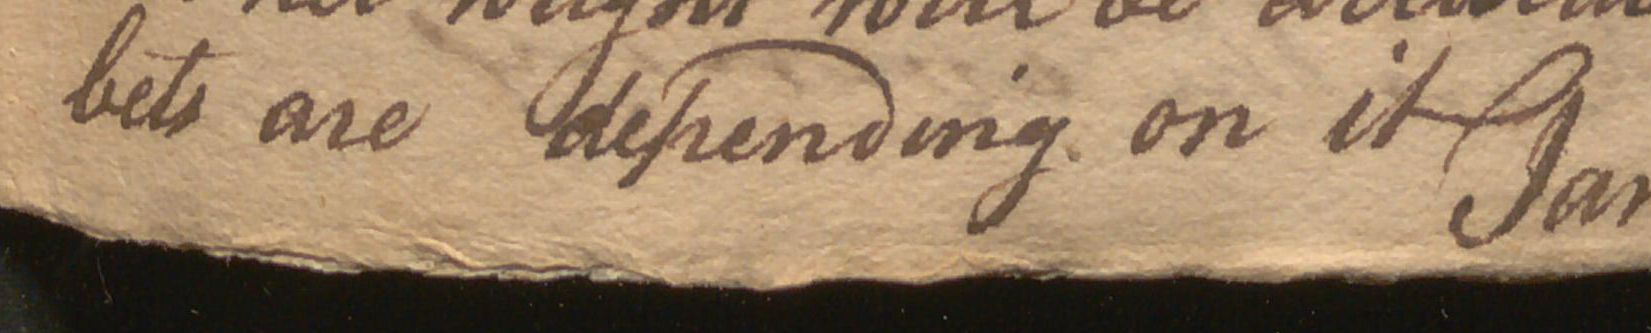bets are depending on it
